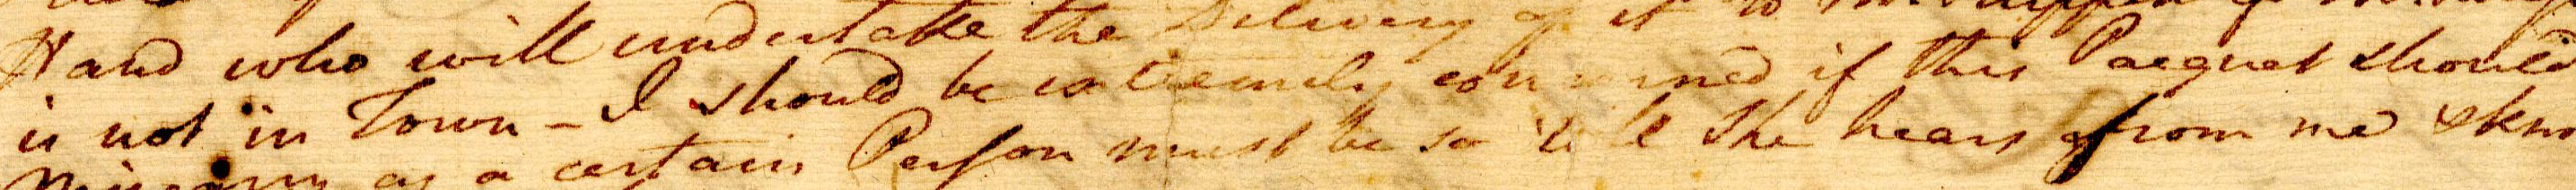is not in Town- I should be extremely concerned if this Pacquet should
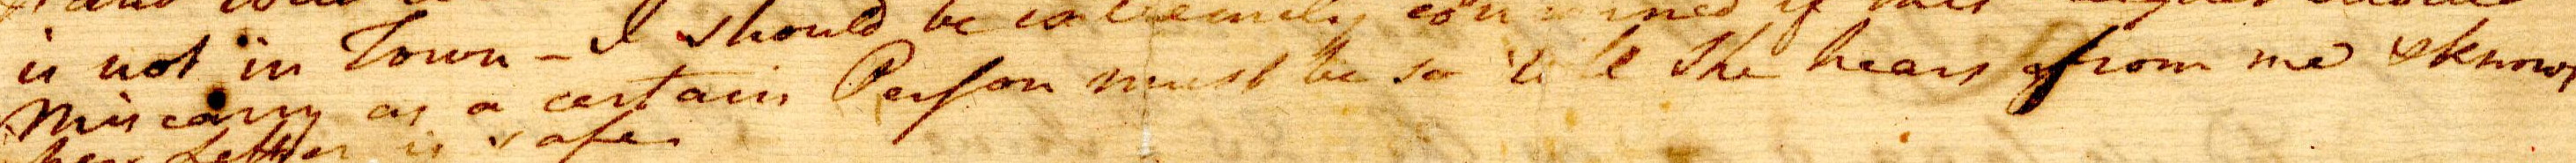miscarry as a certain Person must be so till she hears from me & knows
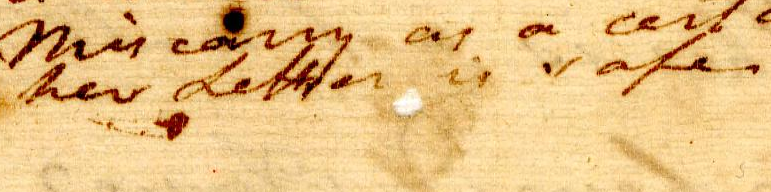her Letter is safe
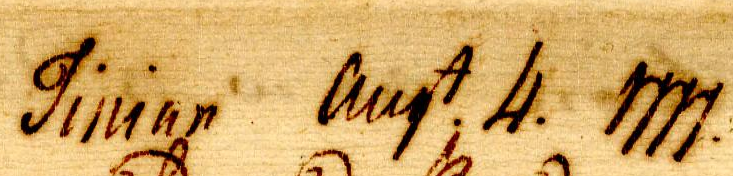Tinian Aug^t. 4. 1777.
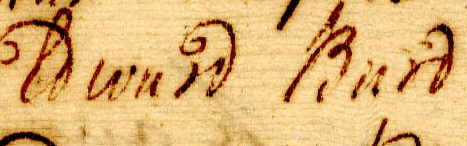Edward Burd
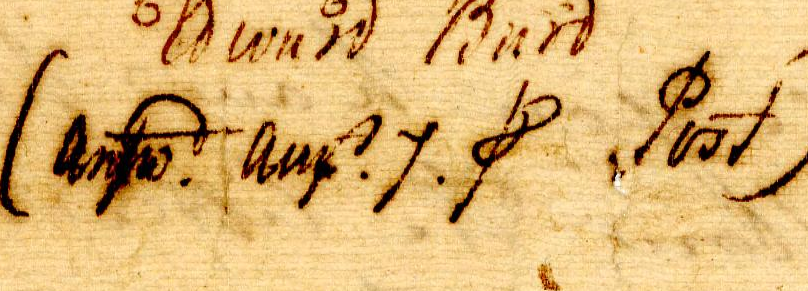(Answ^d. Aug^t. 7. per Post)
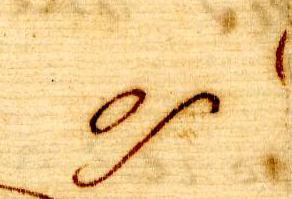To
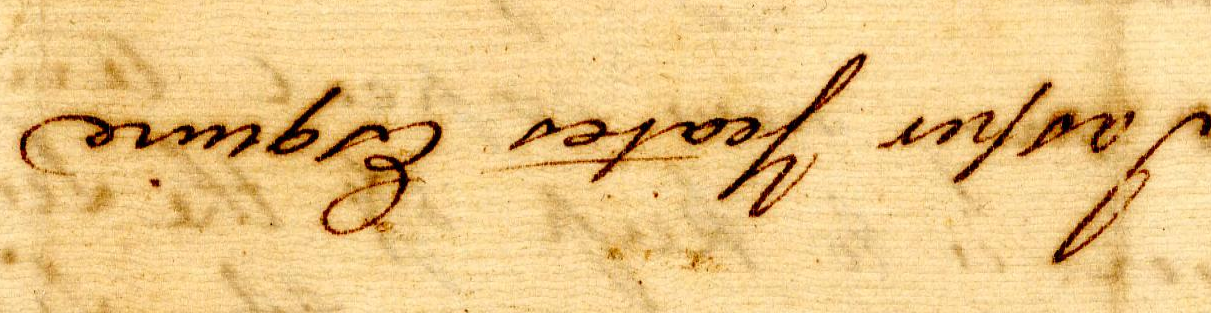Jasper Yeates Esquire
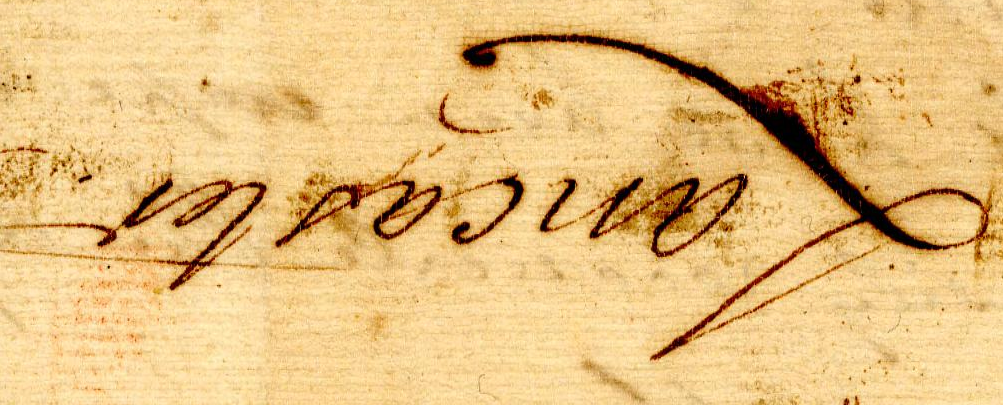Lancaster
